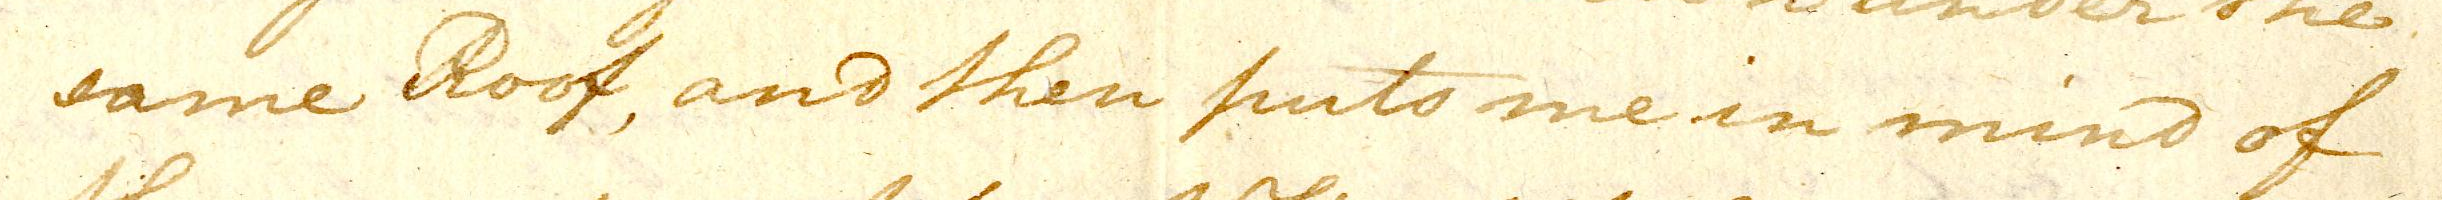same Roof, and then puts me in mind of
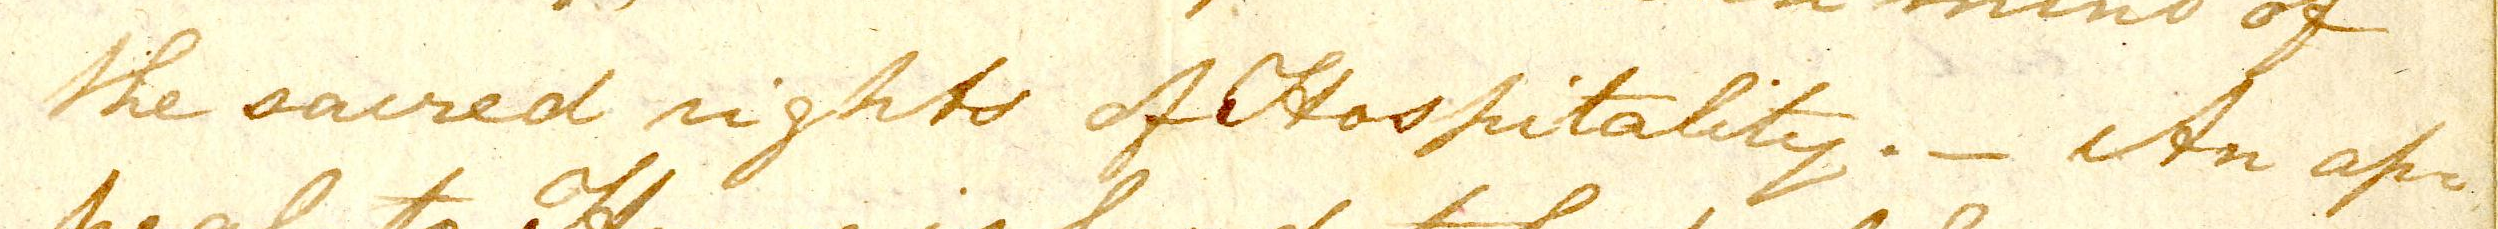the sacred rights of Hospitality.- An ap-
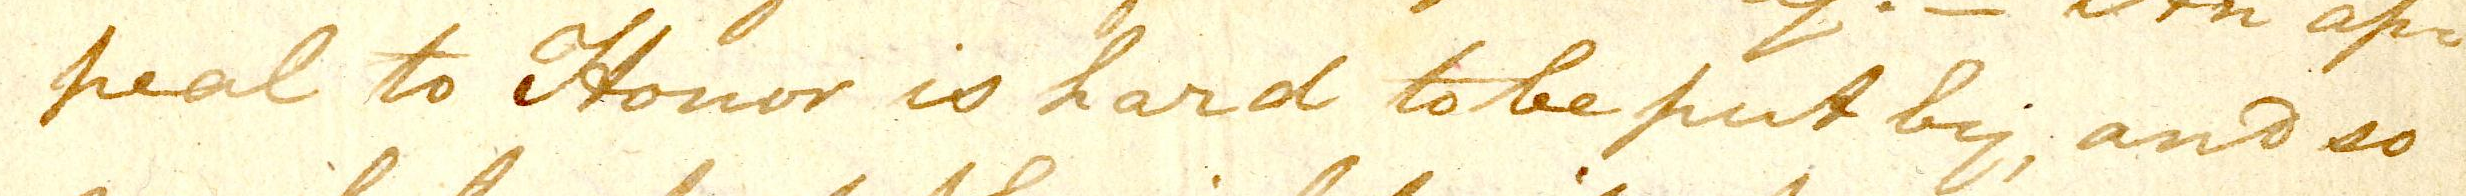peal to Honor is hard to be put by; and so
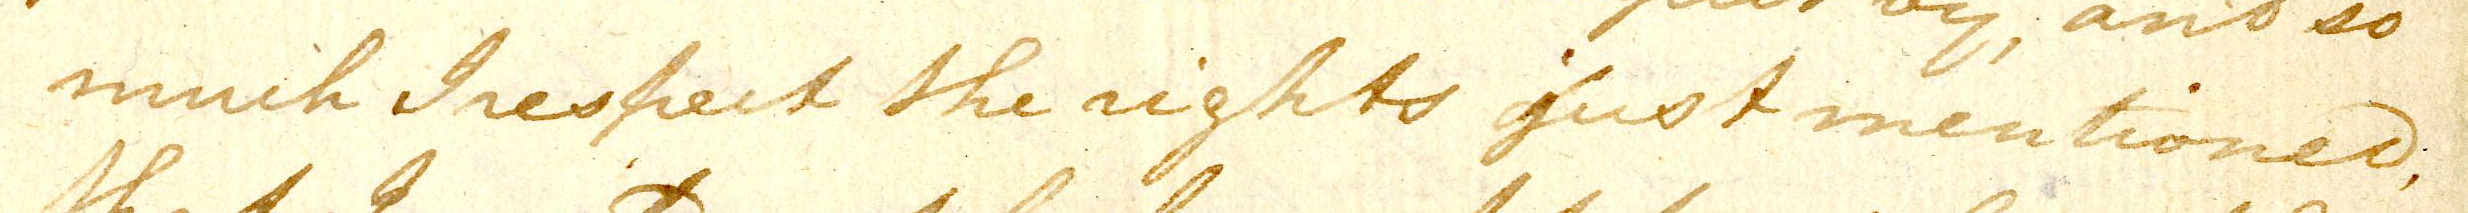much I respect the rights just mentioned;
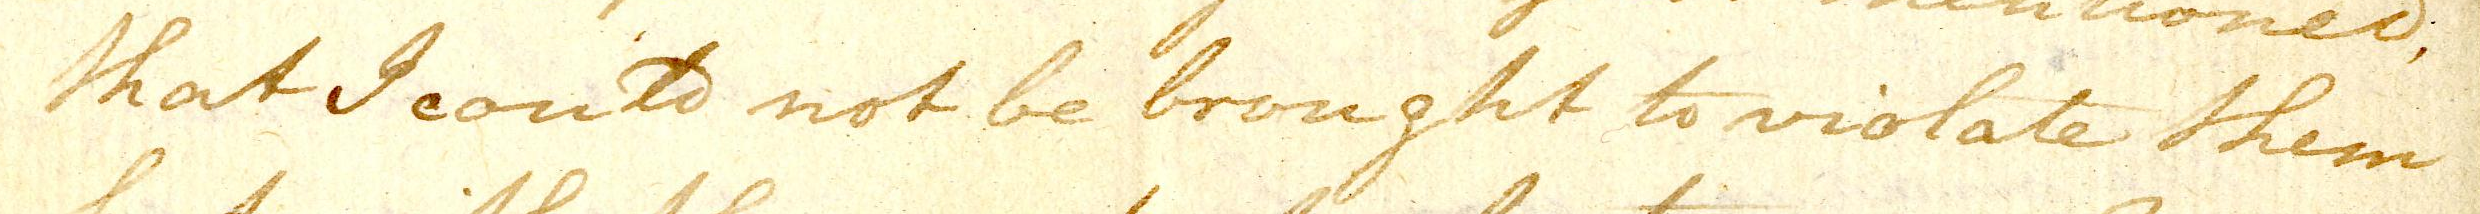that I could not be brought to violate them
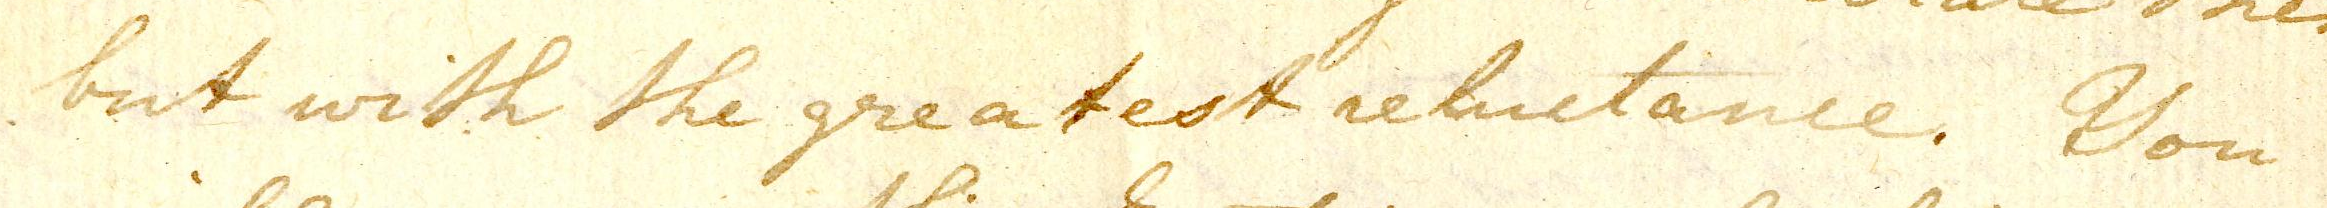but with the greatest reluctance. You
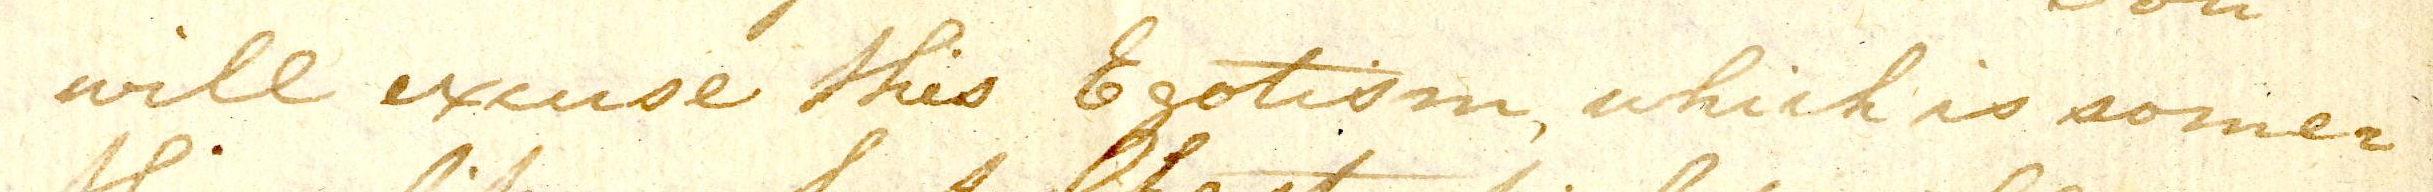will excuse this Egotism,which is some-
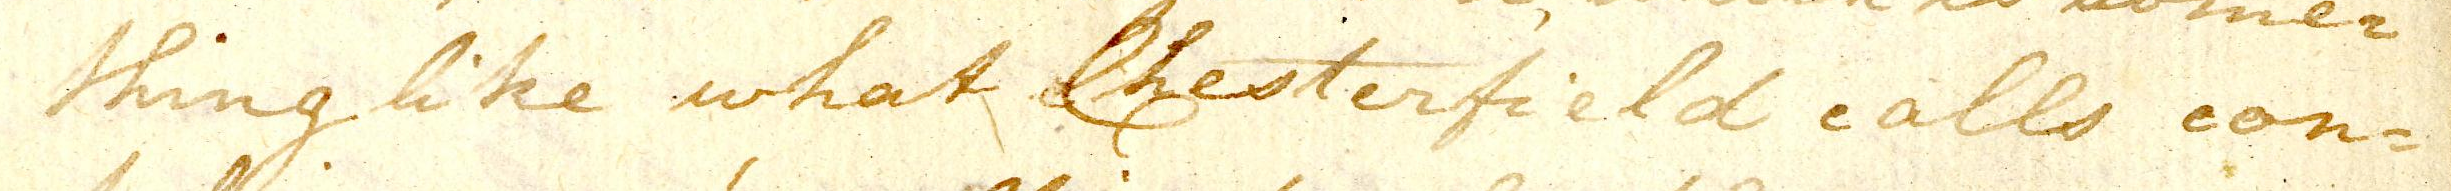thing like what Chesterfield calls con-
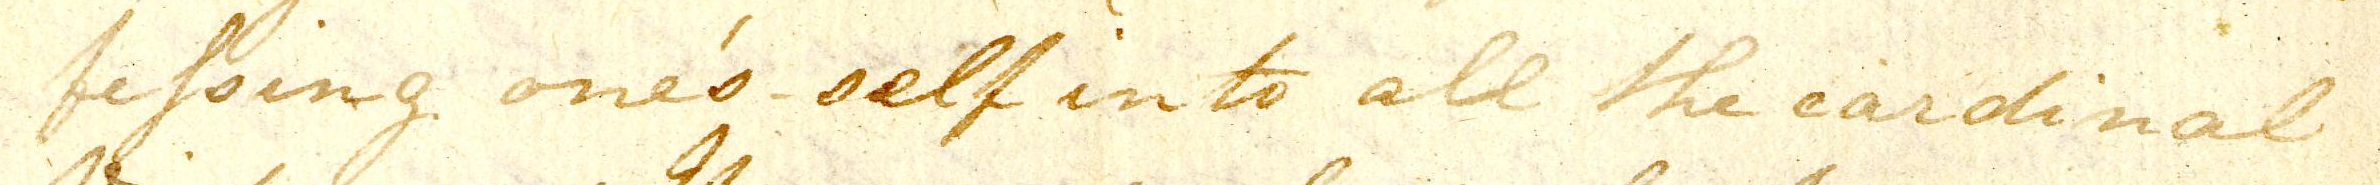fessing one's self into all the cardinal
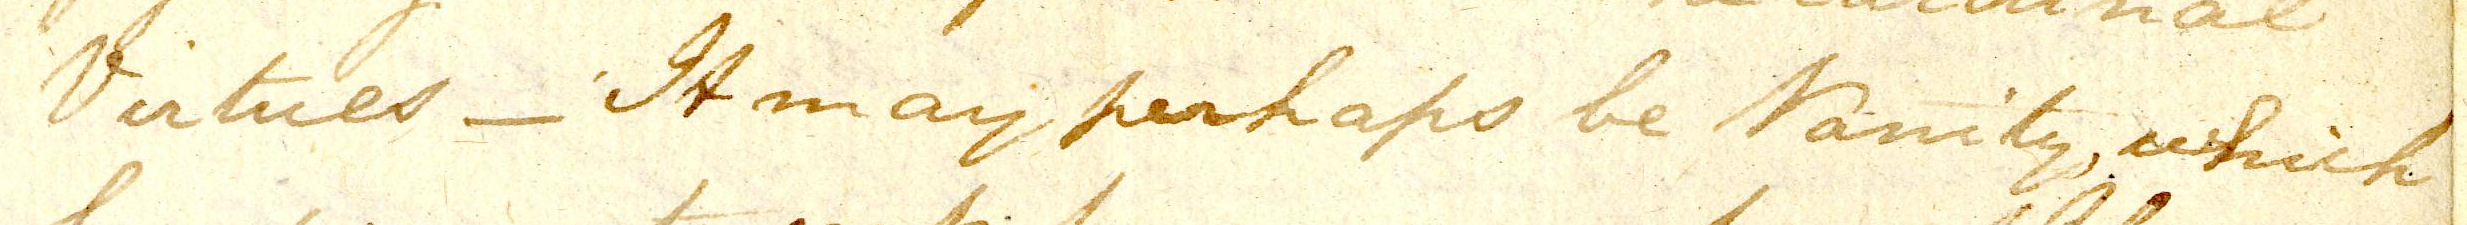Virtues- It may perhaps be Vanity, which
